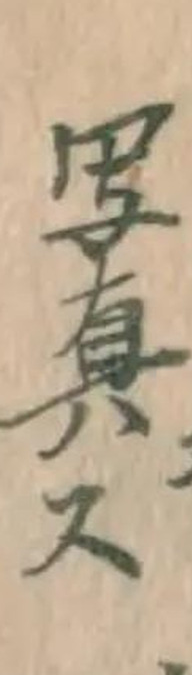写真ス

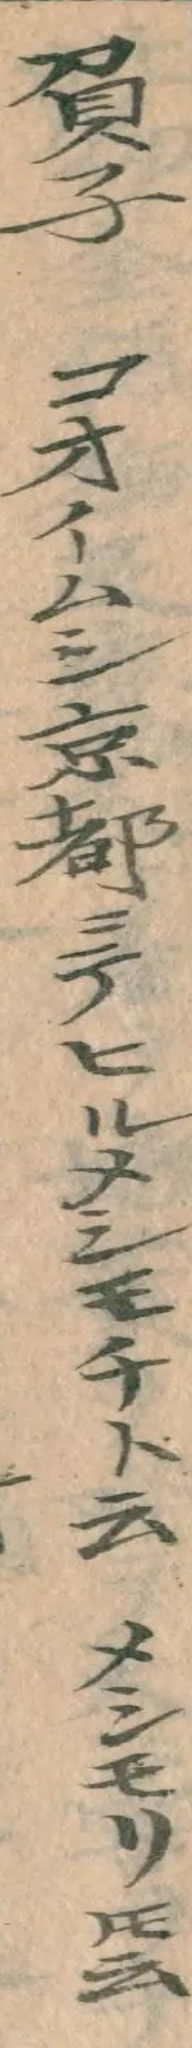負子コオイムシ京都ニテヒルメシモチト云メシモリトモ云
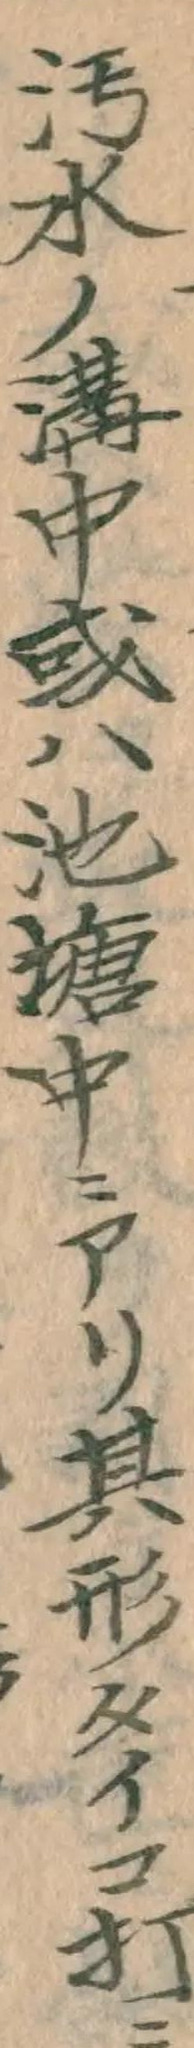汚水ノ溝中或ハ池塘中にアリ其形タイコ打ニ
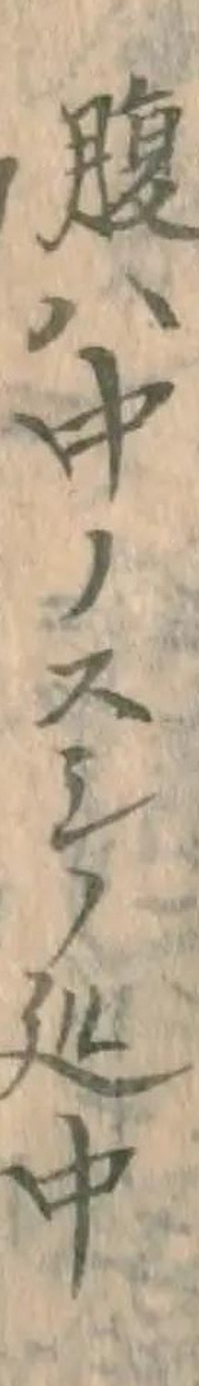腹ハ中ノスシノ処中
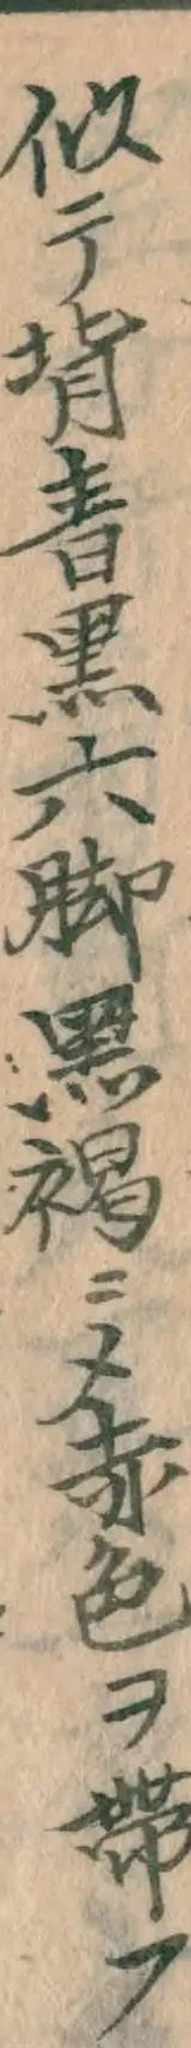似テ背青黒六脚黒褐ニシテ赤色ヲ帯フ
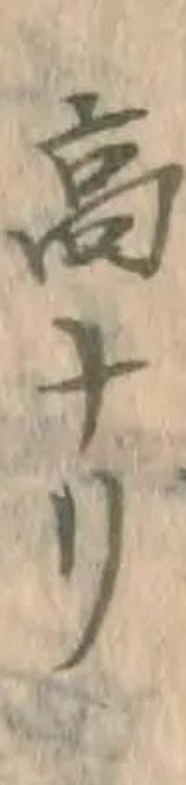高ナリ
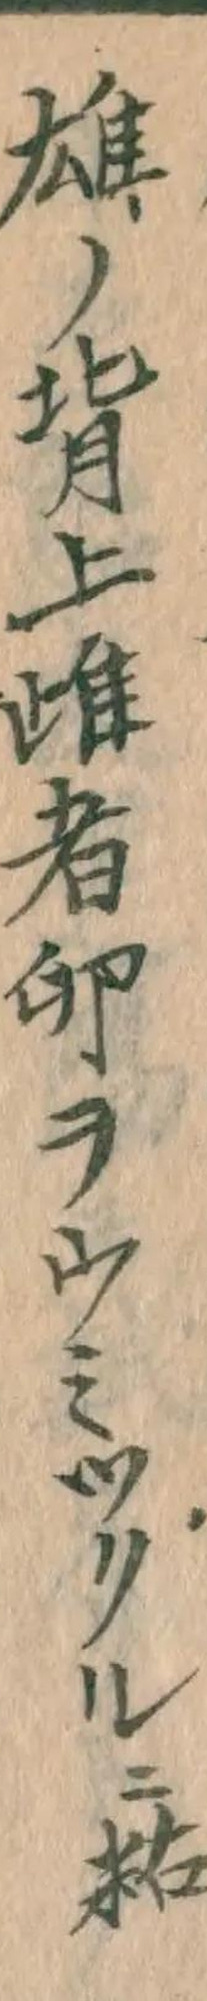雄ノ背上雌者卵ヲウミツクルニ粘
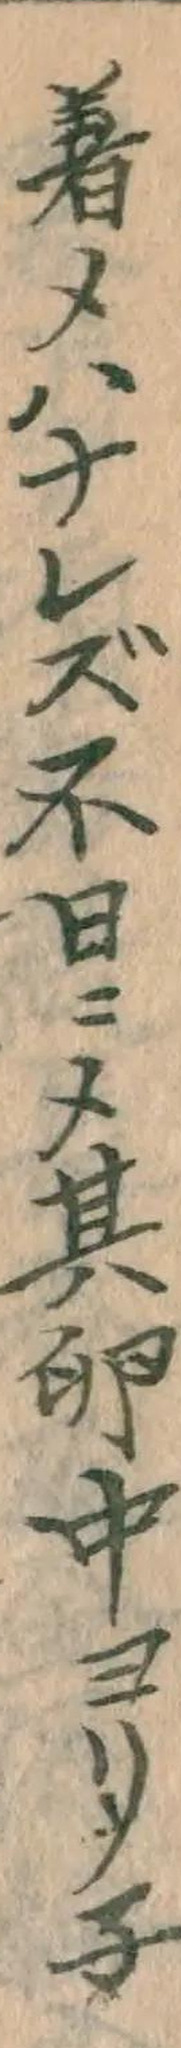着シテハナレズ不日ニシテ其卵中ヨリ子
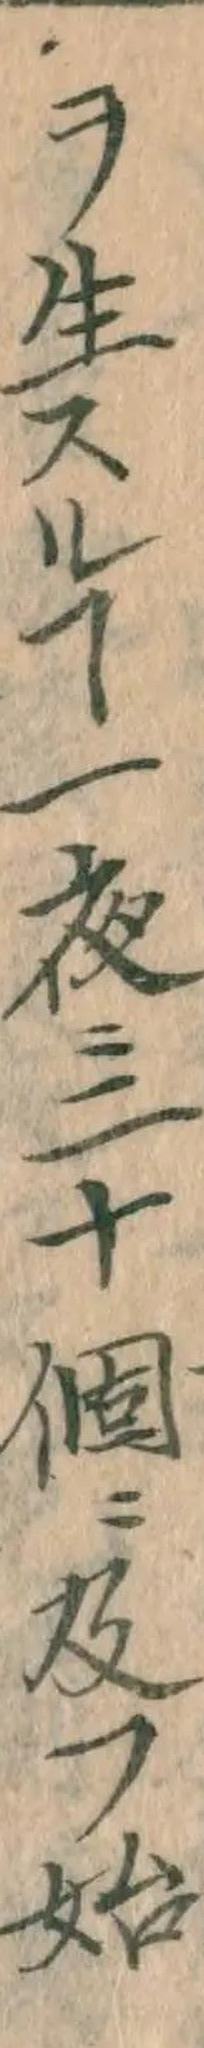ヲ生スルコト一夜ニ二十個ニ及フ始
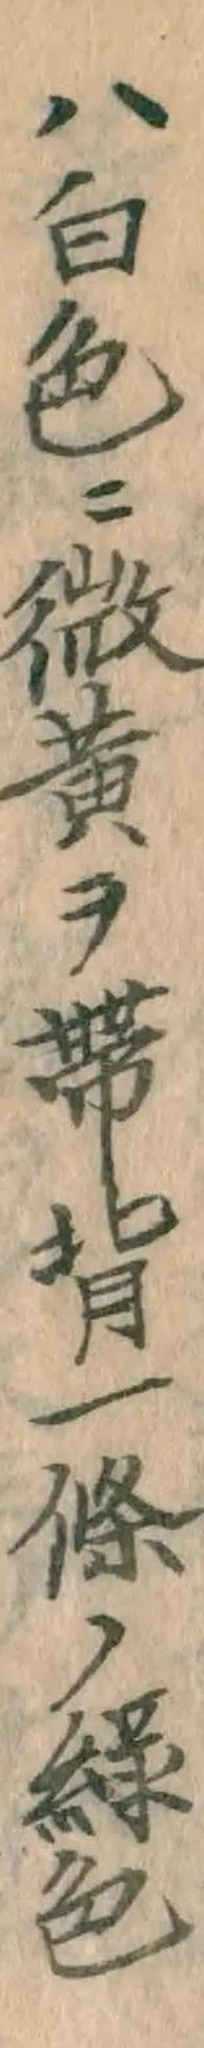ハ白色ニ微黄ヲ帯背一條ノ緑色
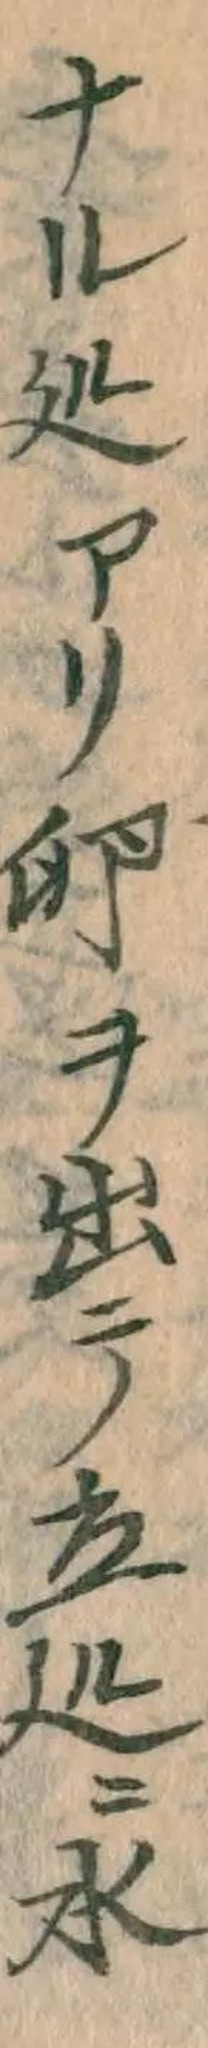ナル処アリ卵ヲ出テ立処ニ水
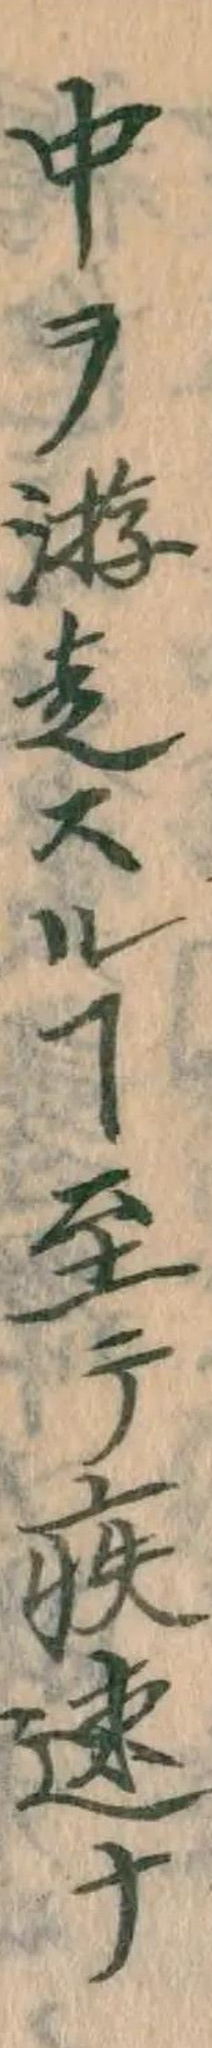中ヲ游走スルコト至テ疾速ナ
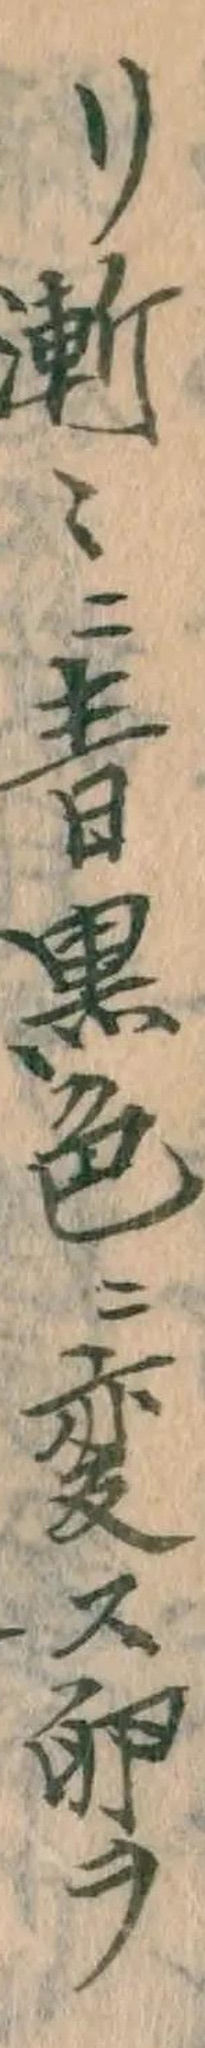リ漸々ニ青黒色ニ変ス卵ヲ
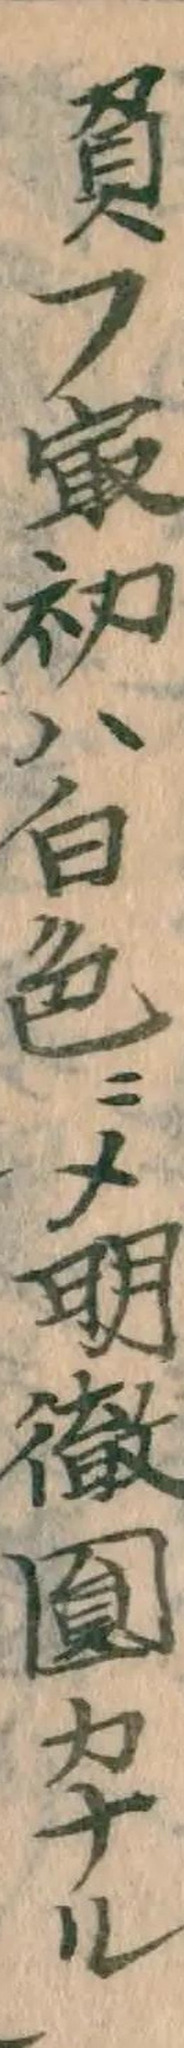負フ最初ハ白色ニシテ明徹円カナル
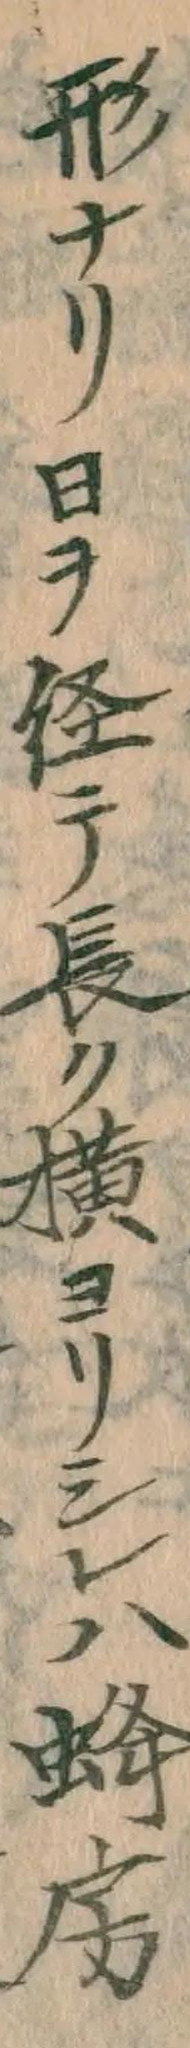形ナリ日ヲ経テ長ク横ヨリシレハ蜂房
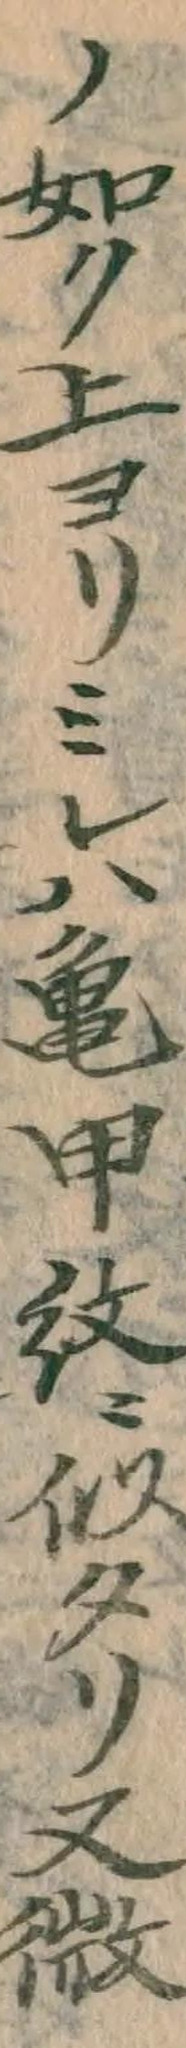ノ如ク上ヨリミレハ亀甲紋ニ似タリ又微
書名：千蟲譜 3巻. [3]
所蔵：国立国会図書館 National Diet Library, JAPAN
